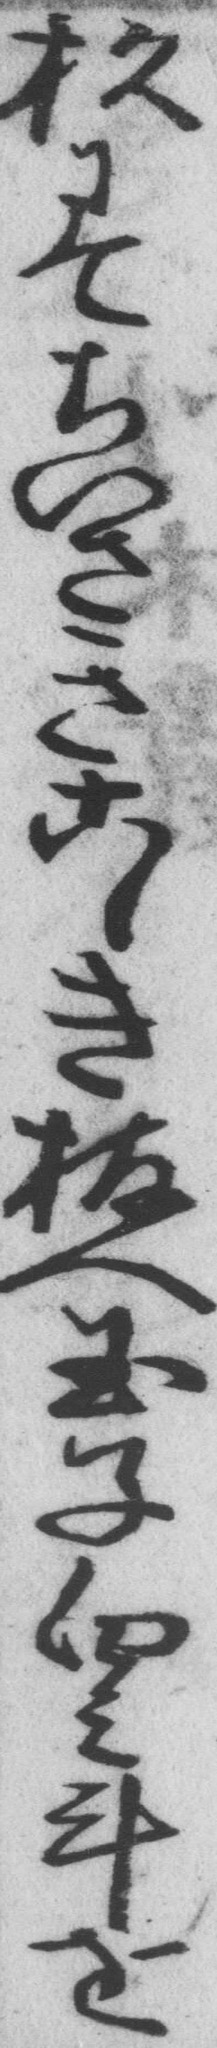杉にてちいさきこしき板へ玉子白み斗を
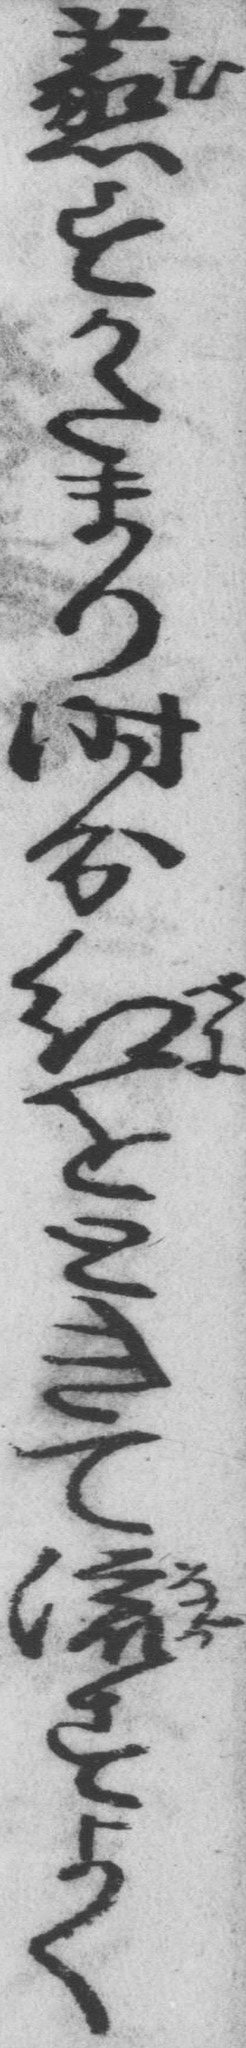蒸すかたまり時分紅をときて流すよく
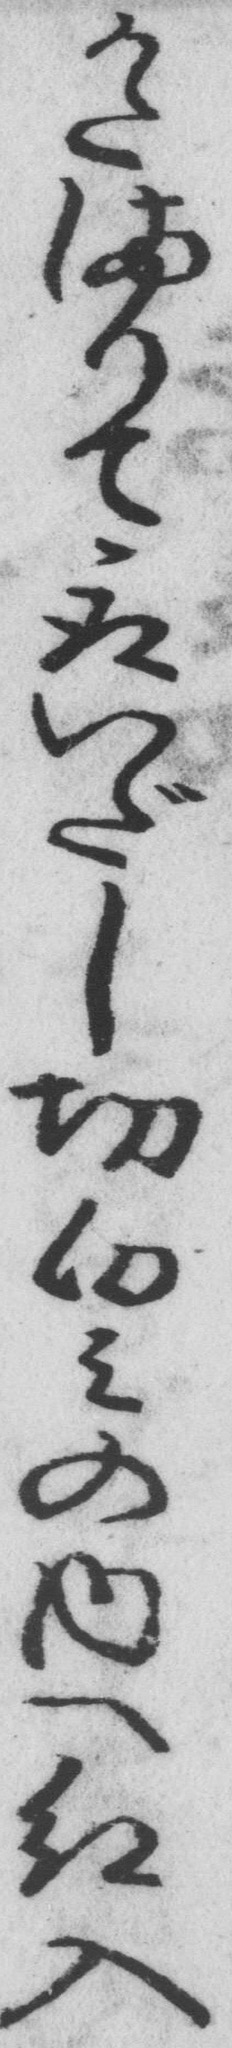かたまりて取いたし切白みの内へ紅入
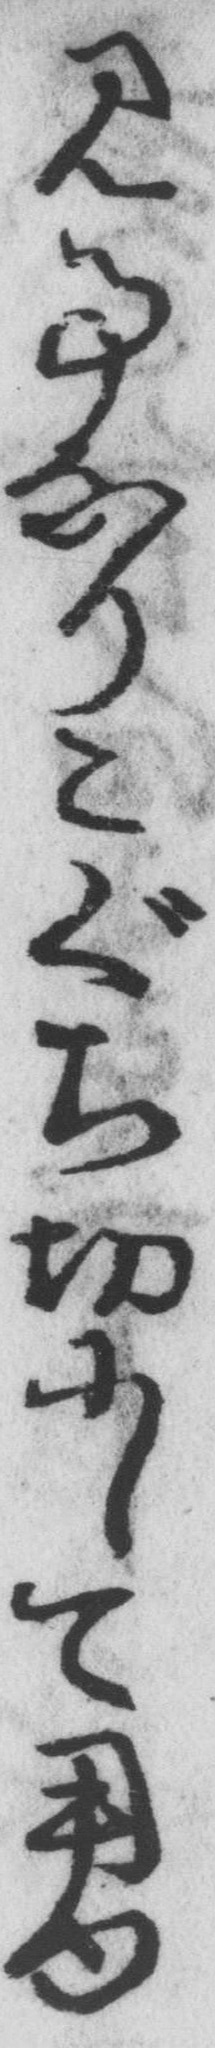見事なりこぐち切にして用ゆ
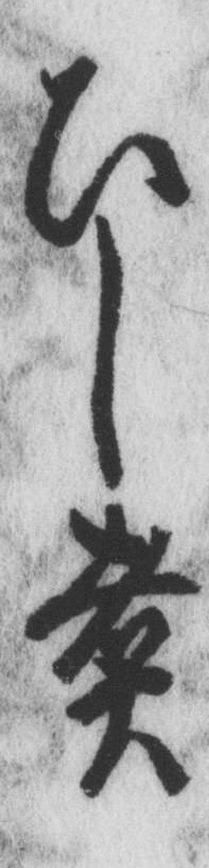ひし煮
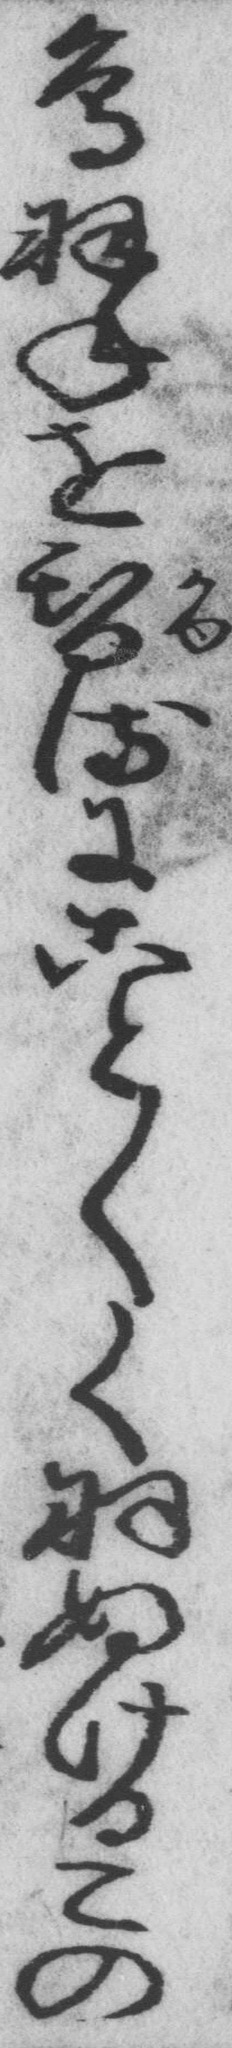鳥羽ねを替るにこと〳〵く羽ぬけるこの
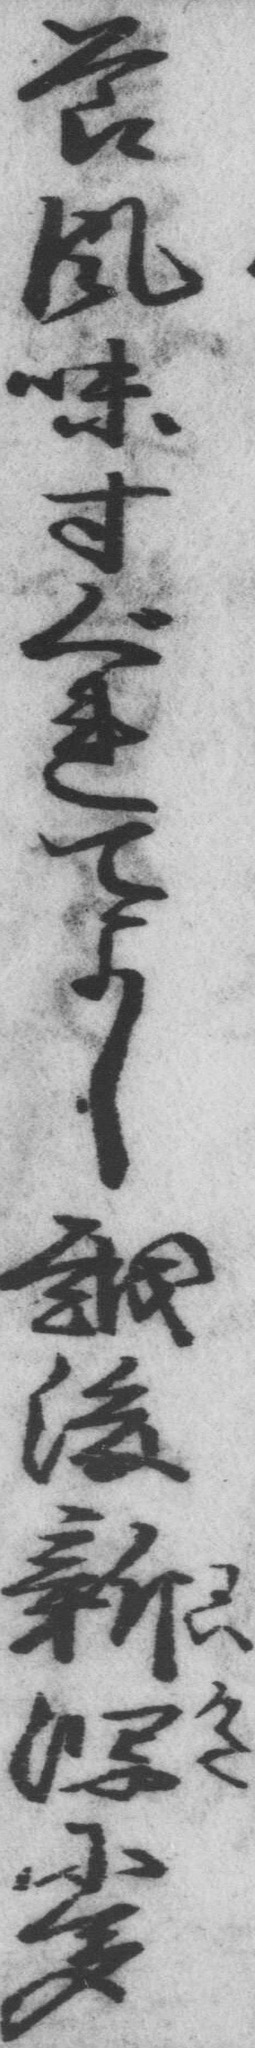節風味すぐれてよし越後新潟に多
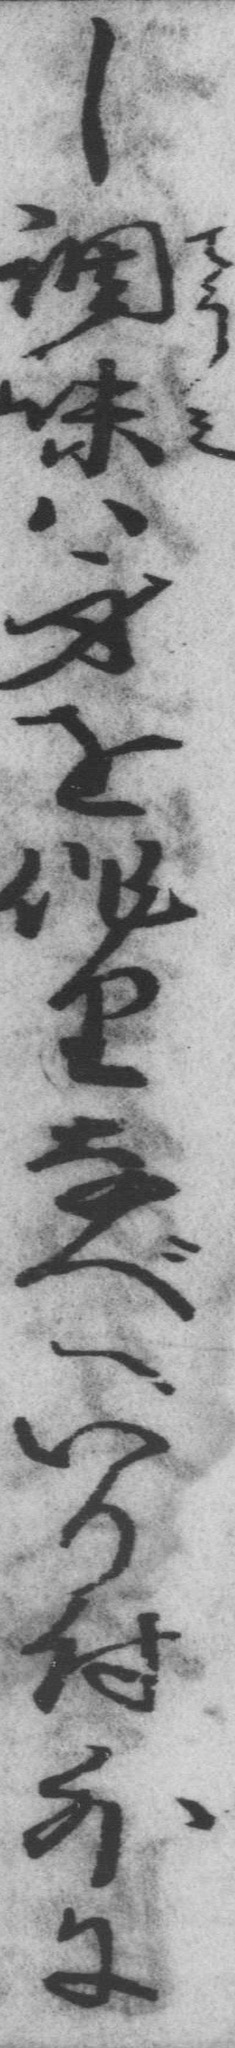し調味は身を作りなべへいり付外に

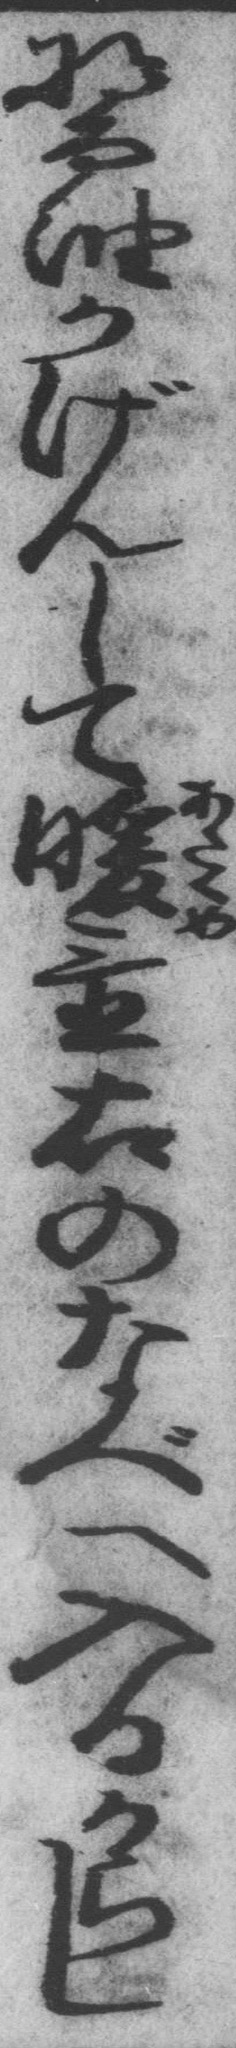醤油かげんして暖置右のなべへ入るからし
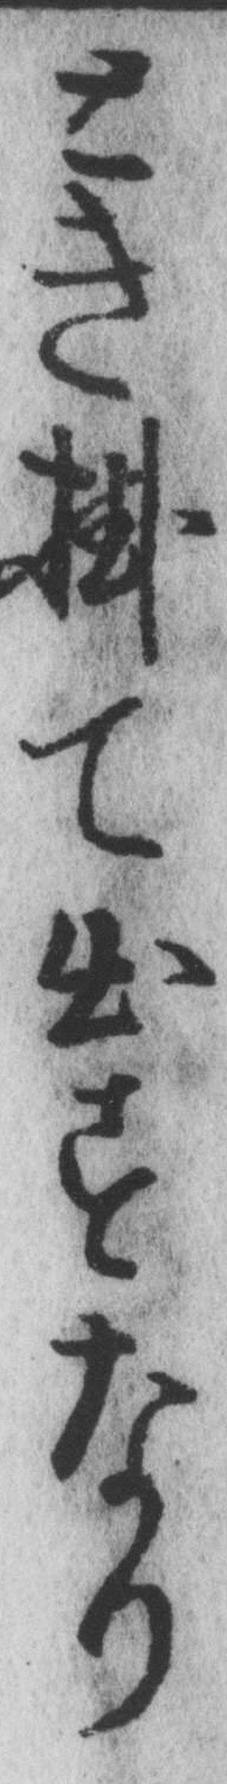とき掛て出すなり
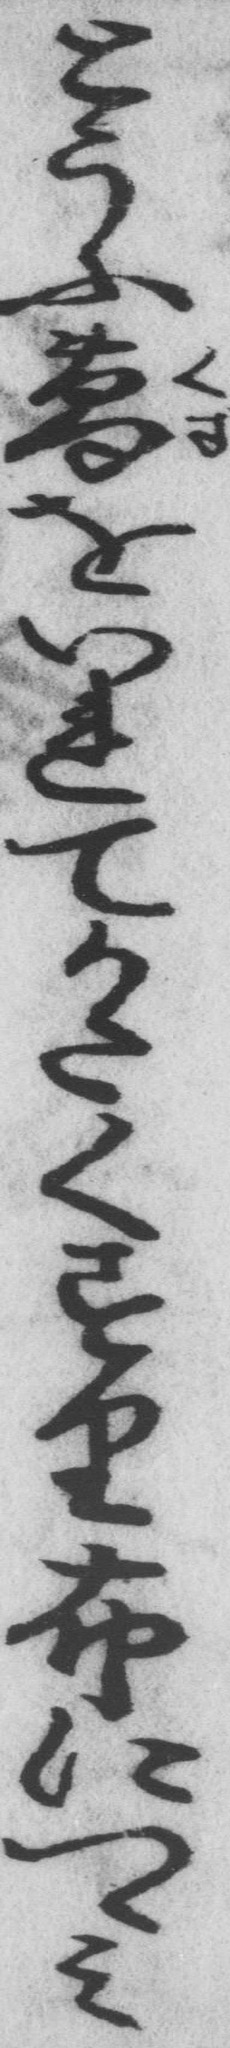とうふ葛をいれてかたくすり布につゝみ
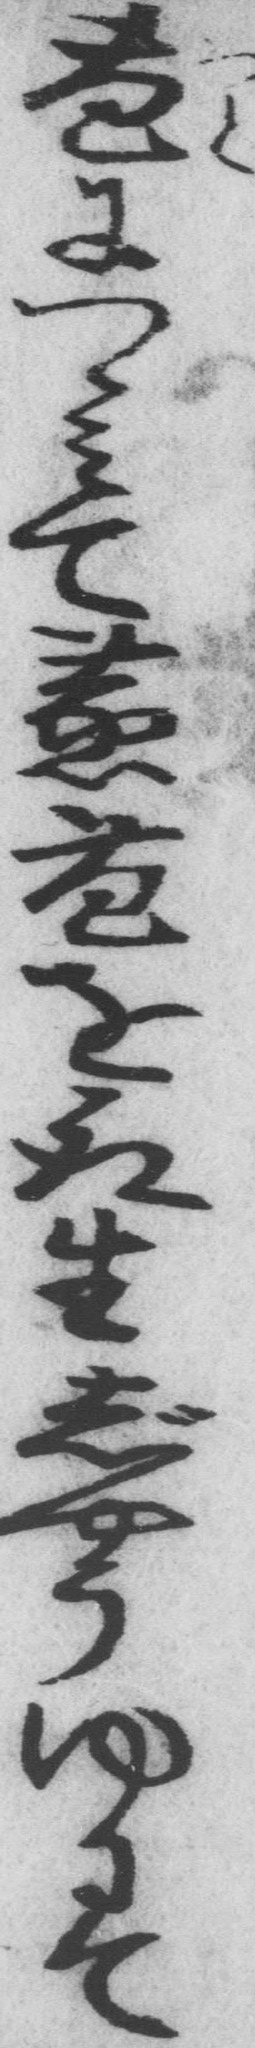苞につゝみて蒸苞を取生じやうゆにて
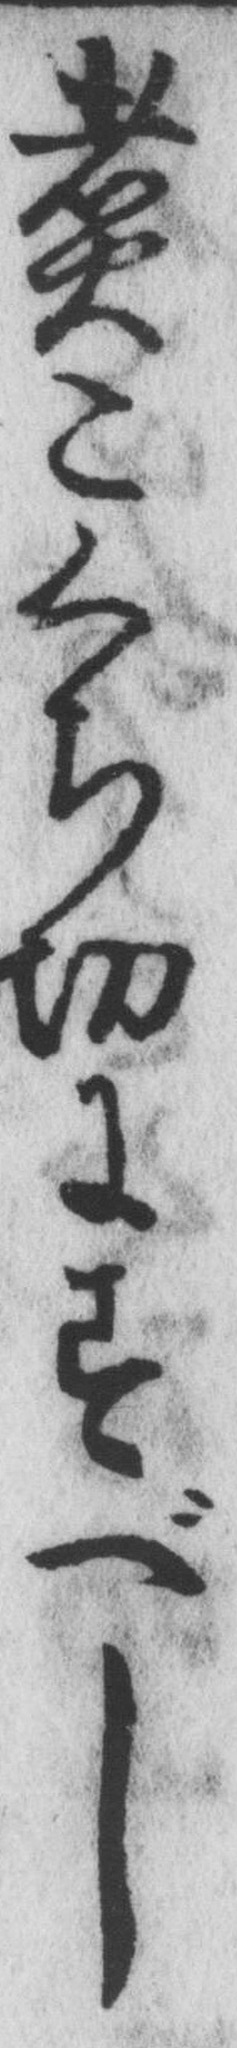煮こくち切にすべし
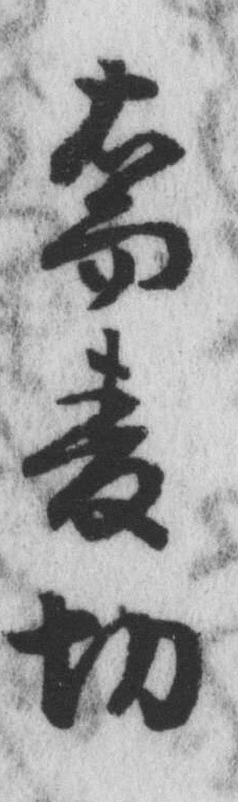蕎麦切
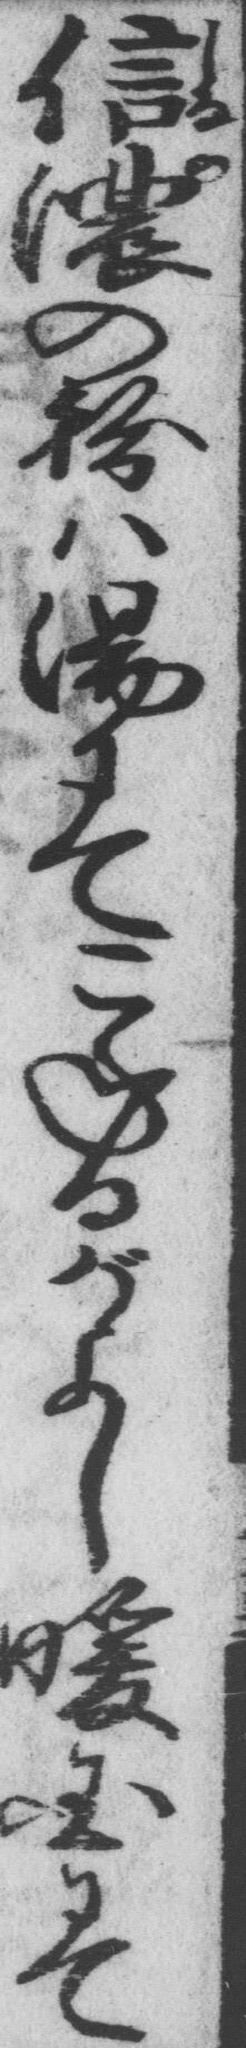信濃の粉は湯にてこねるがよし暖国にて
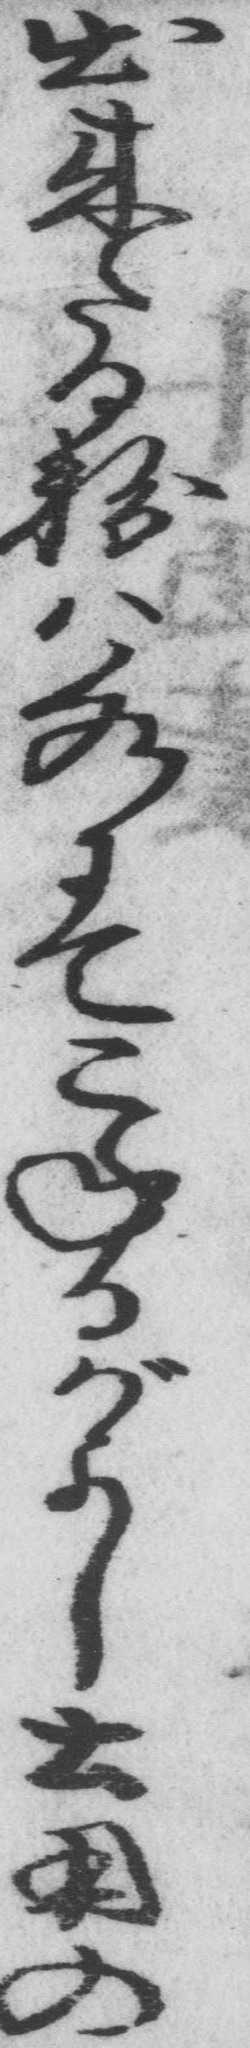出来たる粉は水にてこねるがよし土用の
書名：料理山海郷
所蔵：大阪府立大学学術情報センター 国文学研究資料館
